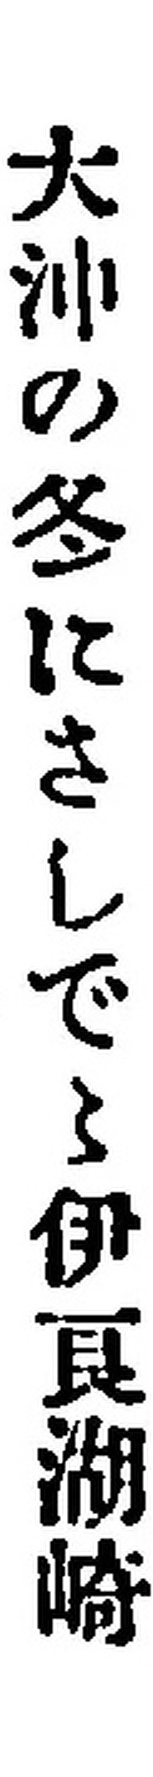大沖の冬にさしでゝ伊良湖崎
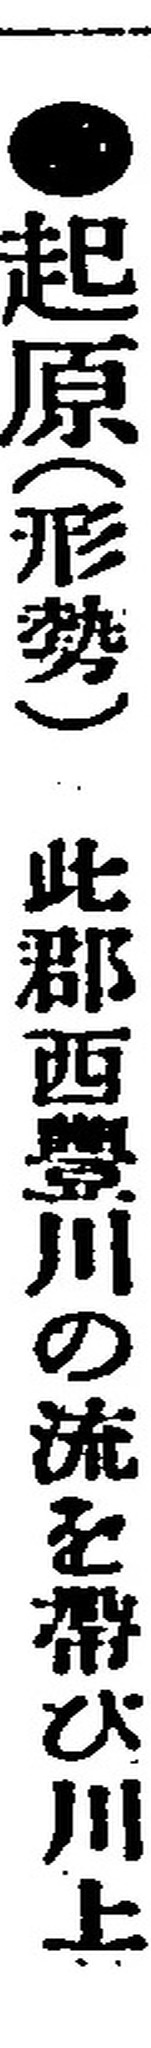●起原(形勢)此郡西豊川の流を帯び川上
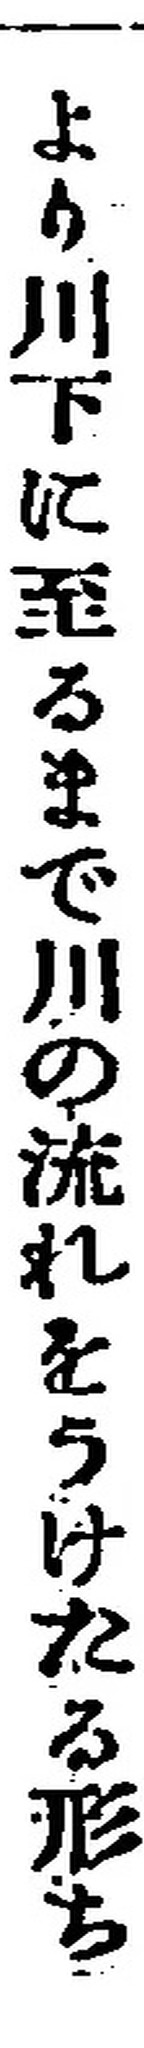より川下に至るまで川の流れをうけたる形ち
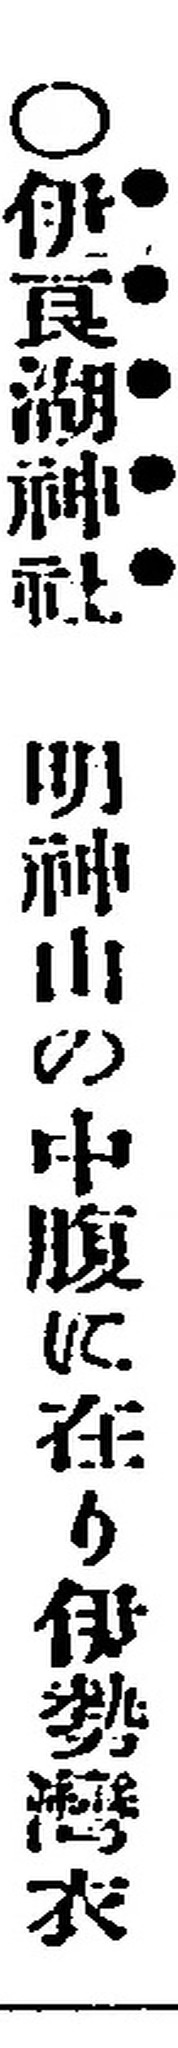○伊良湖神社明神山の中腹に在り伊勢湾衣
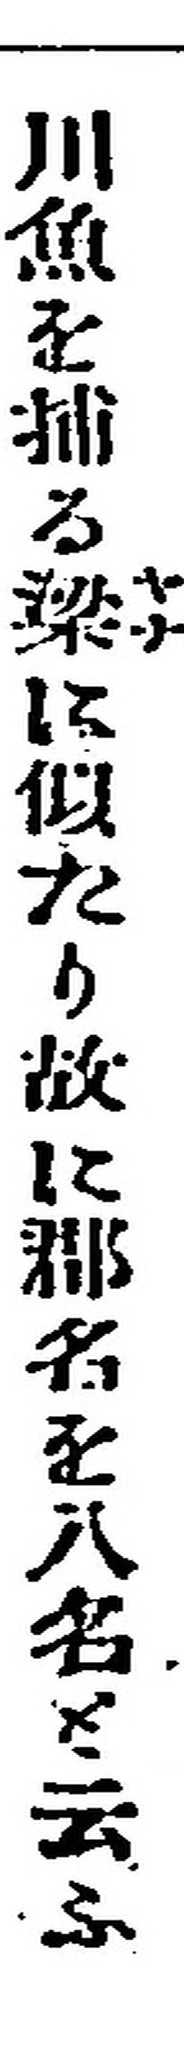川魚を捕る梁に似たり故に郡名を八名と云ふ
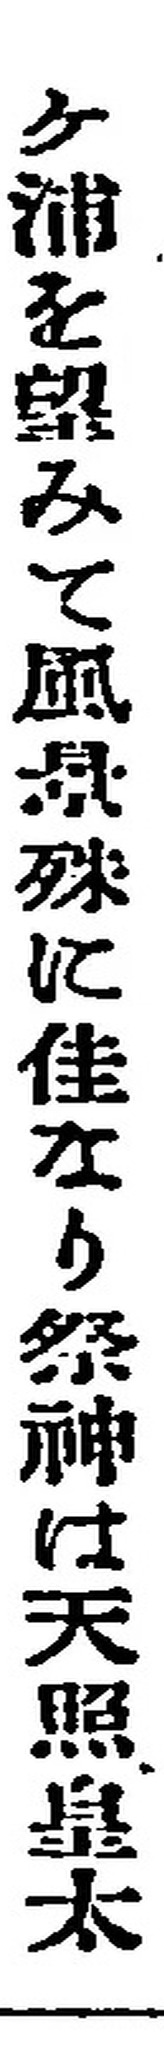ヶ浦を望みて風景殊に佳なり祭神は天照皇太
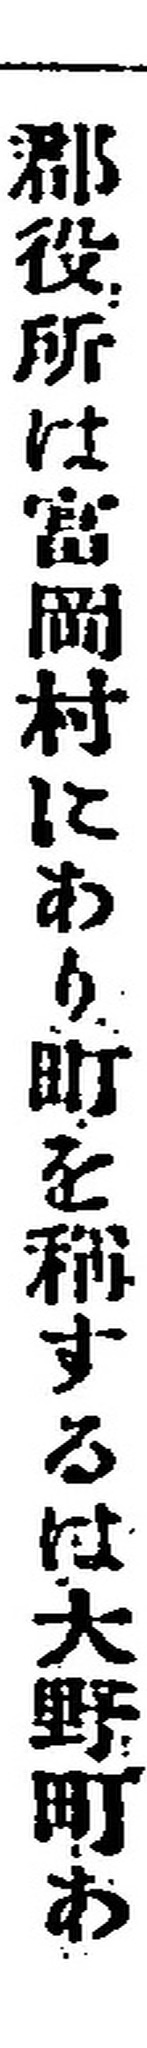郡役所は富岡村にあり町を称するは大野町あ
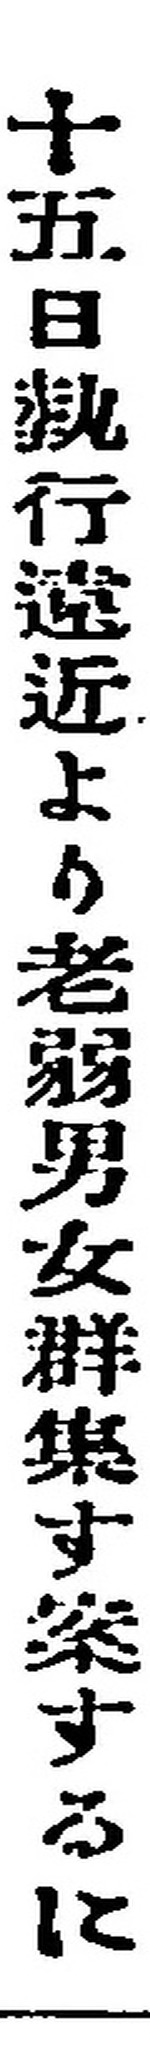十五日埶行遠近より老弱男女群集す案するに
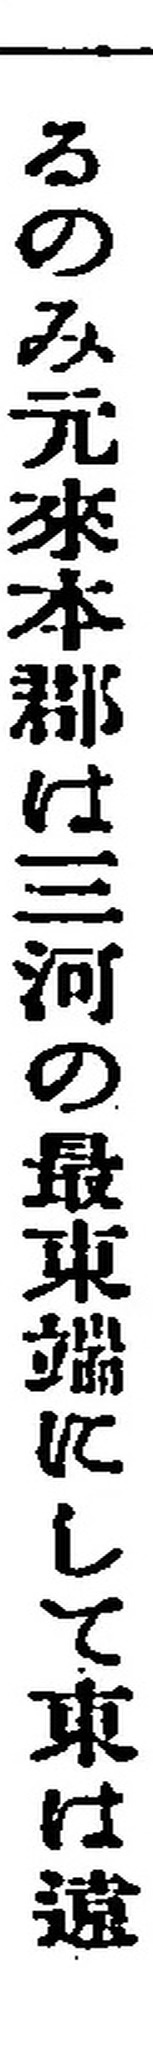るのみ元来本郡は三河の最東端にして東は遠
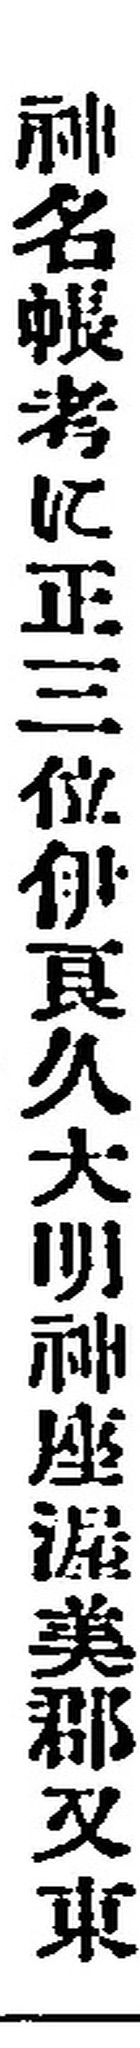神名帳考に正三位伊良久大明神座渥美郡又東
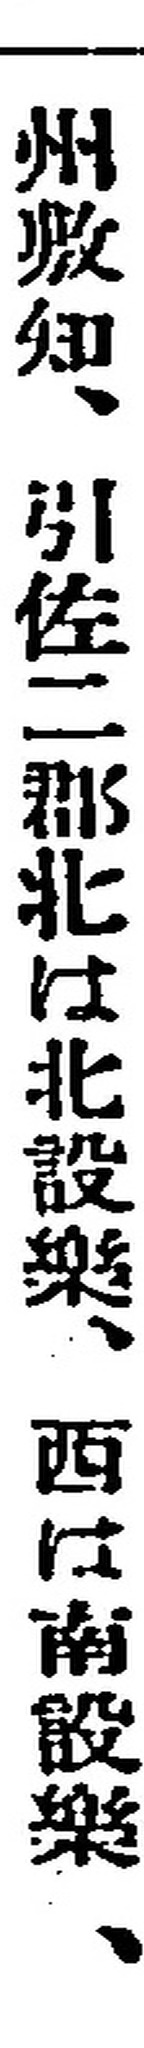州敷知、引佐二郡北は北設楽、西は南設楽、
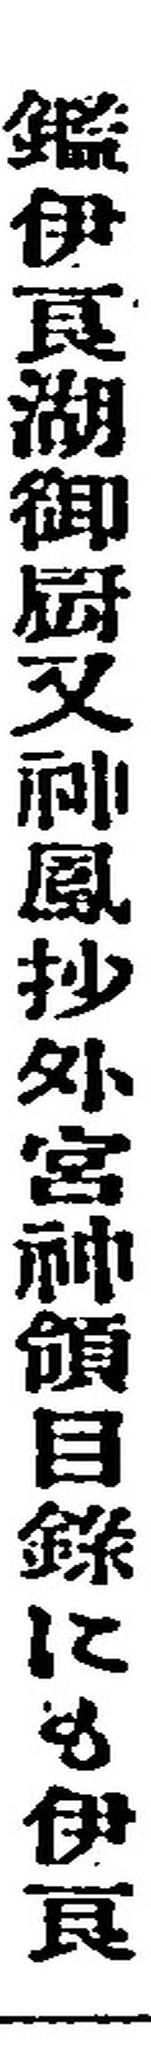鑑伊良湖御厨又神鳳抄外宮神領目録にも伊良
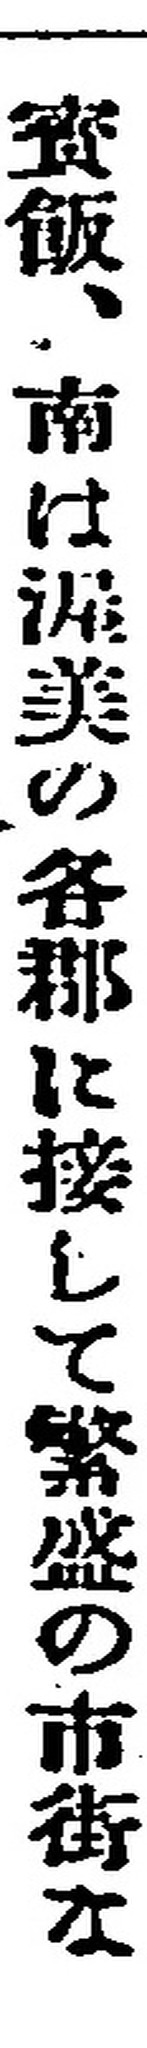宝飯、南は渥美の各郡に接して繁盛の市街な
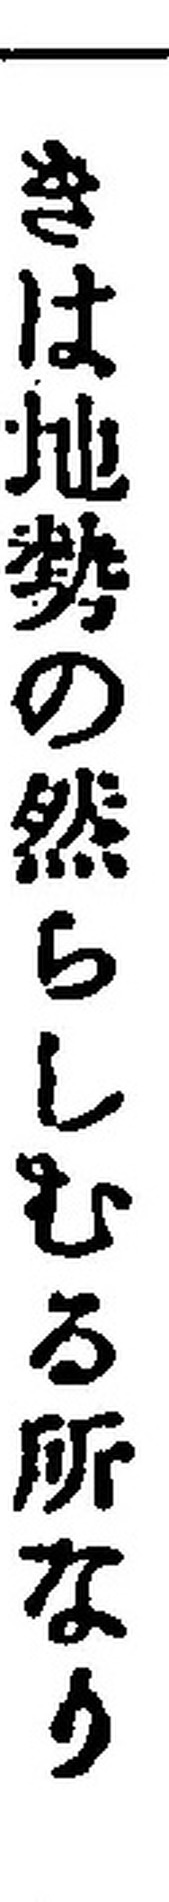きは地勢の然らしむる所なり
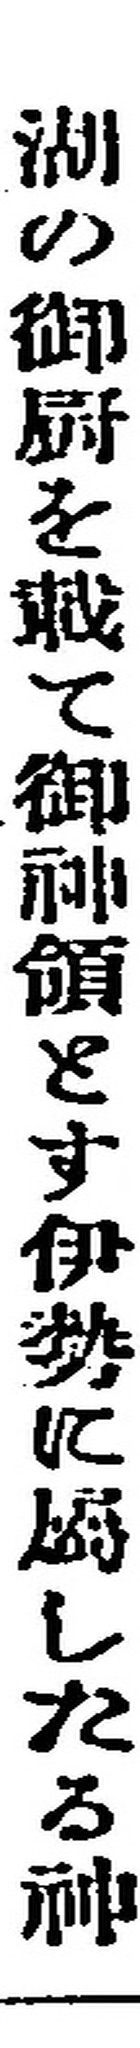湖の御厨を載て御神領とす伊勢に属したる神
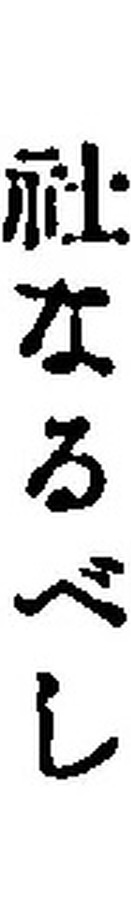社なるべし
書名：東参名勝案内
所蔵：国立国会図書館 National Diet Library, JAPAN
